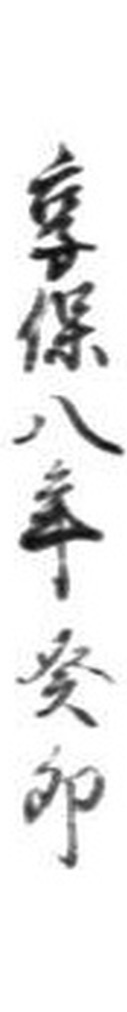享保八年癸卯
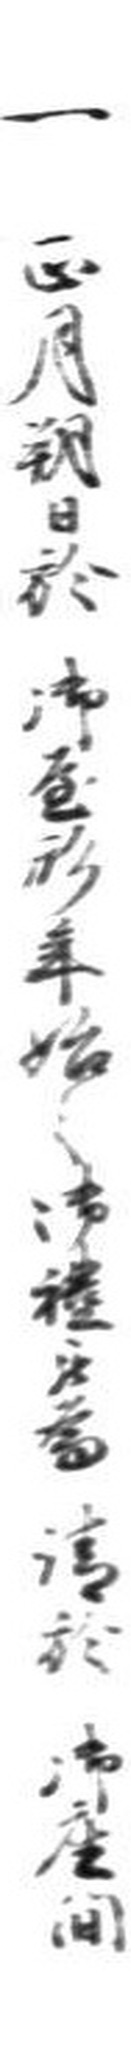一正月朔日於御屋形年始之御礼被為請於御座間
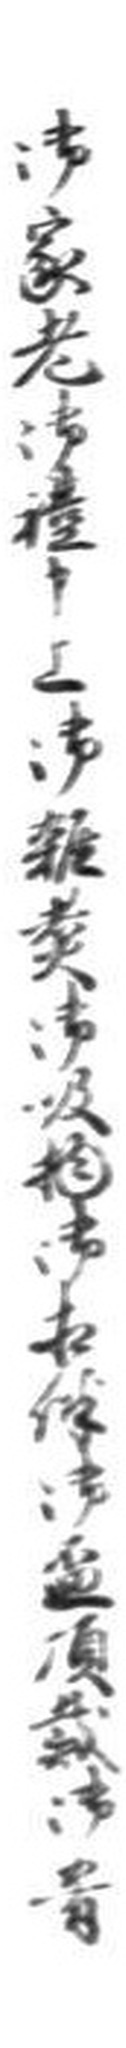御家老御礼申上御雑煮御吸物御相伴御盃頂戴御肴
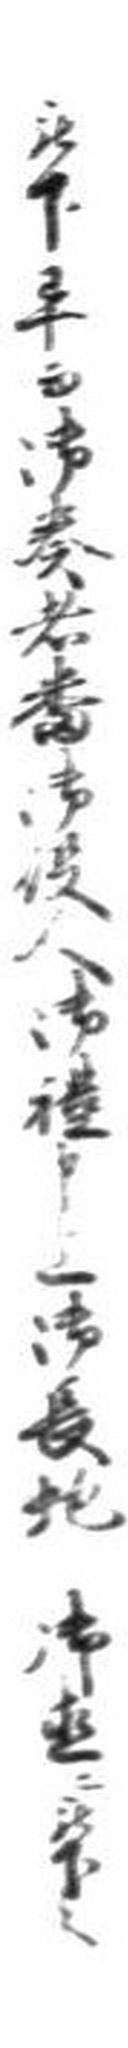被下畢而御奏者番御役人御礼申上御長蚫御直ニ被下之
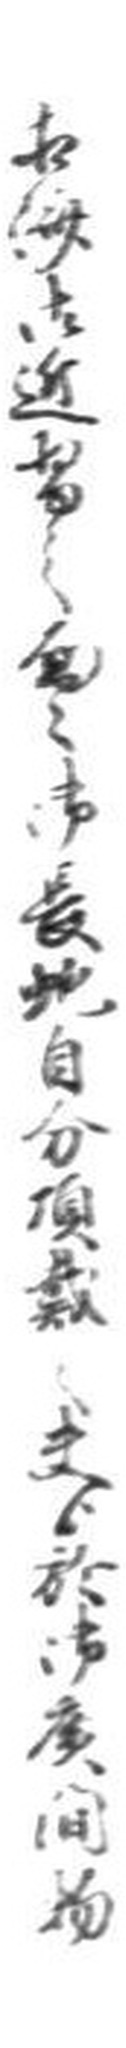相済御近習之面々御長蚫自分頂戴之夫ゟ於御広間物
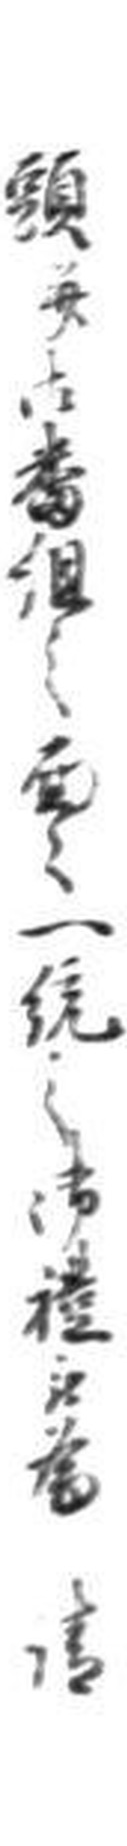頭幷御番組之面々一統之御礼被為請
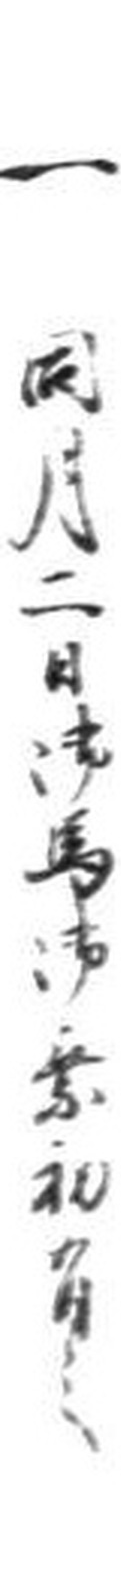一同月二日御馬御乗初有之

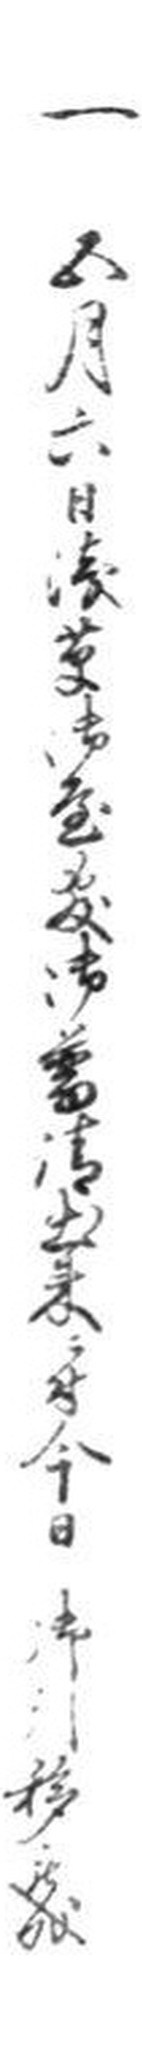一五月六日浅草御屋敷御普請出来ニ付今日御引移被成
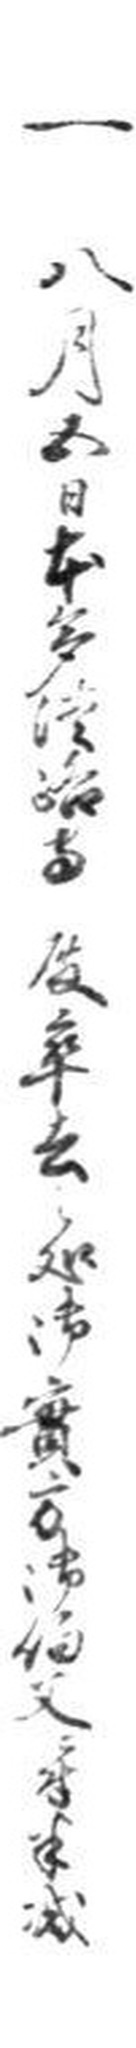一八月五日本多淡路守殿卒去之処御實方御伯父ニ付半減
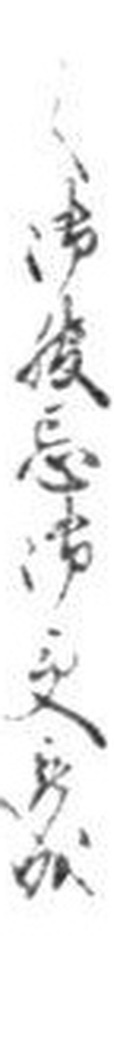之御服忌御受被成
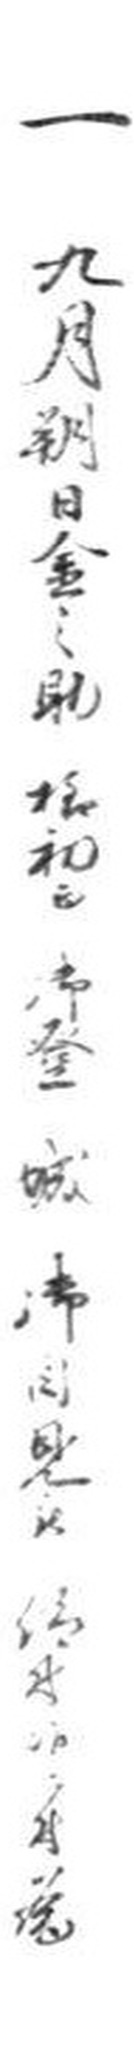一九月朔日金之助様初而御登城御目見被仰付候ニ付為
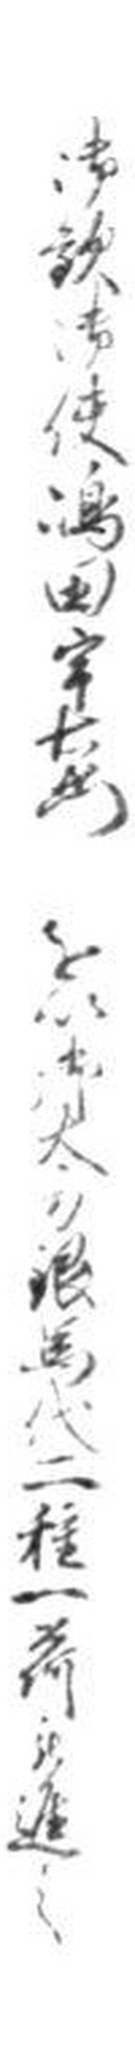御歓御使嶋田宇右衛門を以御太刀銀馬代二種一荷被進之
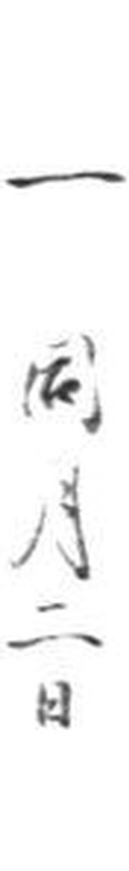一同月二日
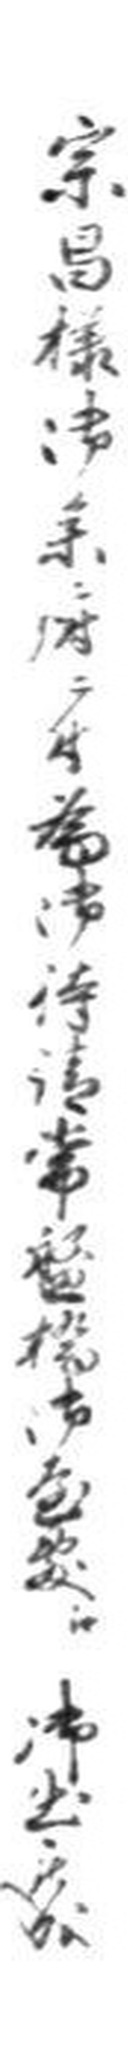宗昌様御参府ニ付為御侍請常盤橋御屋敷江御出被成
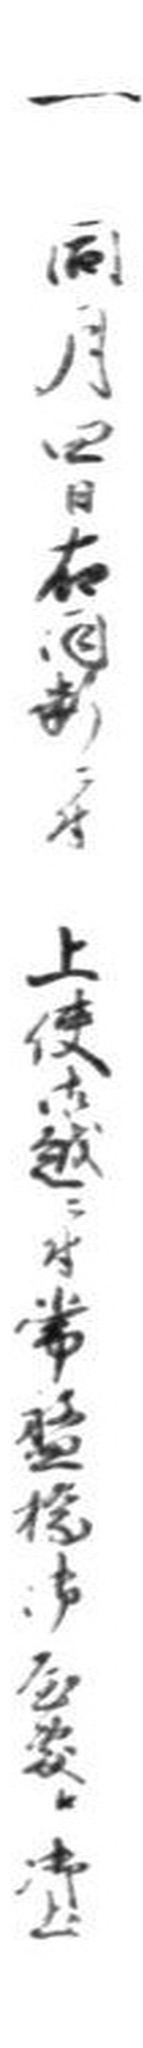一同月四日右同断ニ付上使御越ニ付常盤橋御屋敷江御出
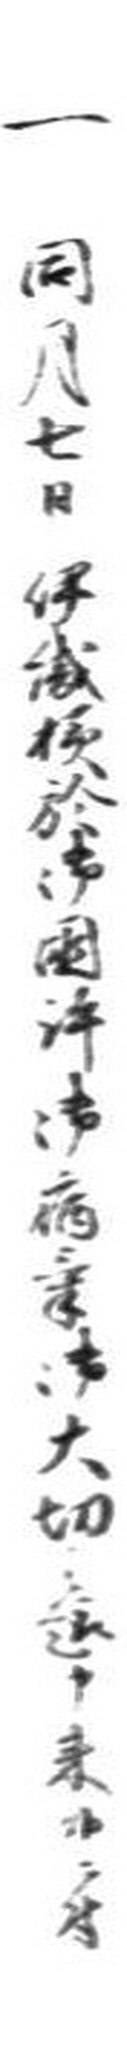一同月七日伊織様於御国許御病気御大切之趣申来候ニ付
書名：家譜 三十七 宗矩公 従正徳五年到享保九年五月
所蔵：福井県文書館 Fukui Prefectural Archives
